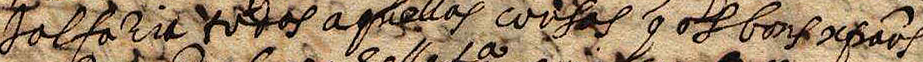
tal fazia todas aquellas cousas q̄ os bons xpaõs
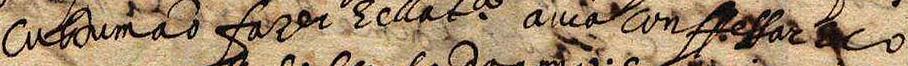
custumaõ fazer E ella ta. a uia conffessar _ co
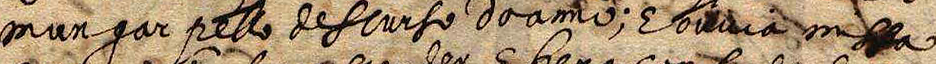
mungar pello descurso do anno; E ouuia missa
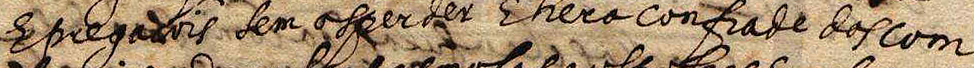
E pregacõis sem os perder E hera confrade das com
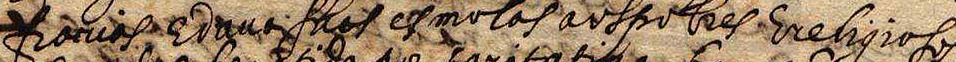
frarias E daua suas esmolas aos pobres E religiosos
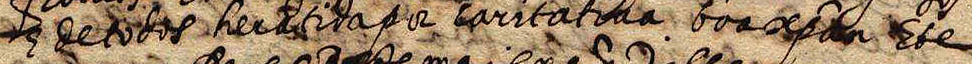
E de todos hera tida por caritatiua boa xpãm E te
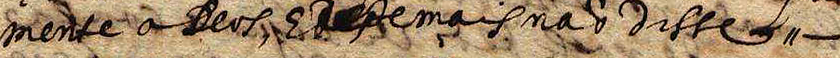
mente a Deos, E d_ste mais naõ disse // -
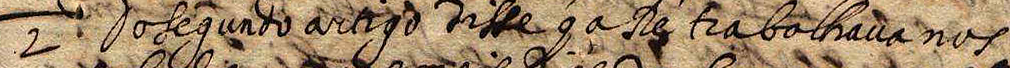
item Do segundo artigo disse q̄ a Ré trabalhaua nos
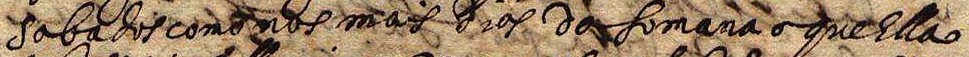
sabados como nos mais dias da somana o que Ella
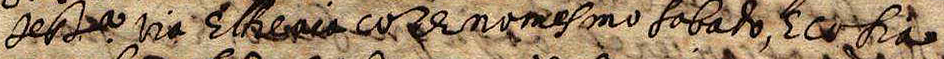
test.a via E lhe uia cozer no mesmo sabado, E cosia
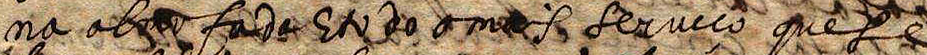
na almofada E todo o mais seruiço que se
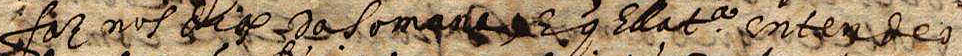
faz nos dias da somana, E q̄ Ella ta. entendeo
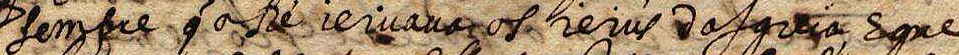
sempre q̄ a Ré ieiuaua os ieius da Jgreia, E que
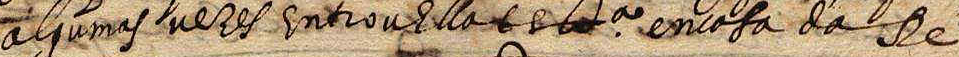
algumas uezes Entrou Ella testa. en casa da Ré
